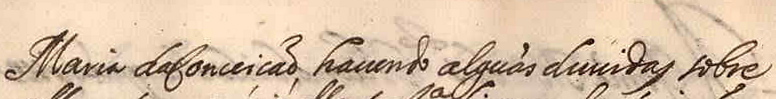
Maria da Conceição, hauendo alguās duuidas sobre
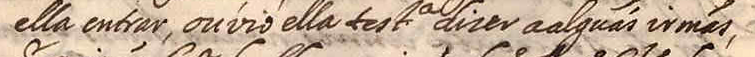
ella entrar, ouvio ella testa dizer a alguas̄ irmās,
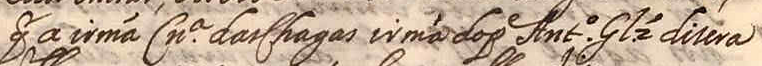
q̄ a irmā Cn.a das Chagas irmā do pe Ant.o Gl.z̄ disera
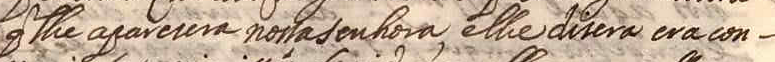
q̄ lhe aparesera nossa senhora, e lhe disera era con
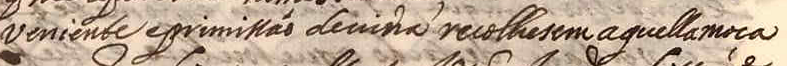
veniente e primissaõ deuina recolhesem aquella moça
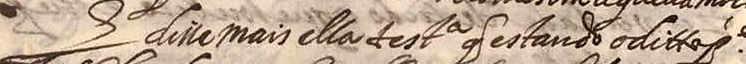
E disse mais ella testa q̄ estando o ditto p.e
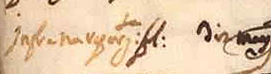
jnfra na reperg.ta fl. diz maes
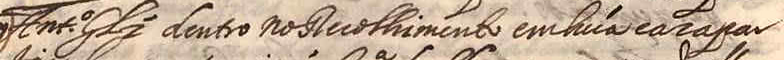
Ant.o Glz̄ dentro no Recolhimento em huā caza par
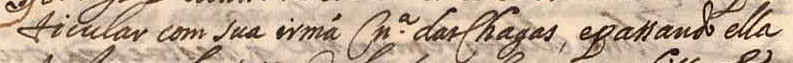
ticular com sua irmā Cn.a das Chagas, e passando ella
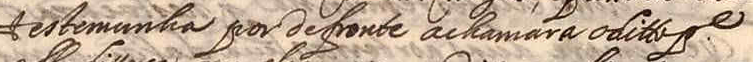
testemunha por defronte a chamara o ditto p.e
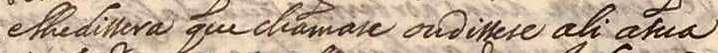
e lhe dissera que chamase ou dissesse ali a sua
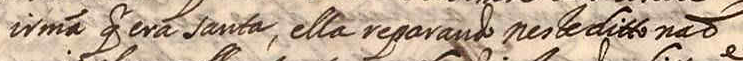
irmā q̄ era santa, ella reparando neste ditto naõ
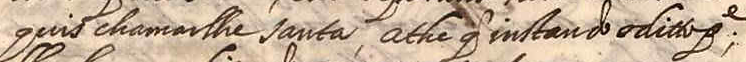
quis chamarlhe santa, athe q̄ instando o ditto p.e
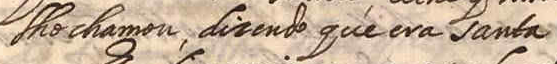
lho chamou, dizendo que era santa
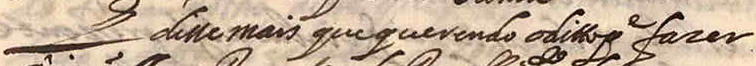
E disse mais que querendo o ditto pe fazer
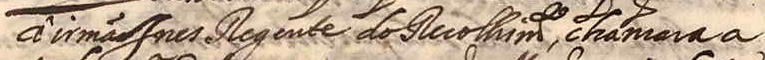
â irmā Jnes Regente do Recolhimto, chamara a
